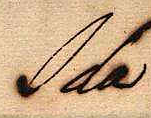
Ida
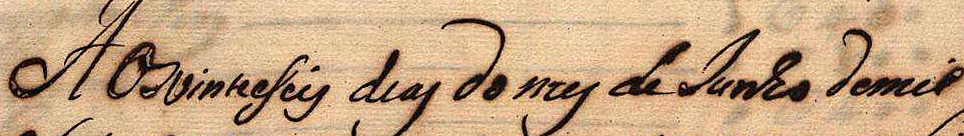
Aos vinte seis dias do mes de Iunho de mil
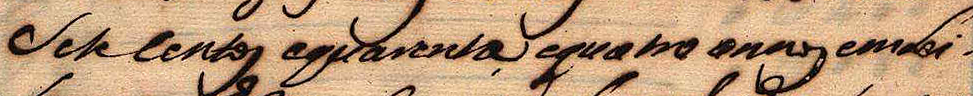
setecentos e quarenta, e quatro annos em Lis
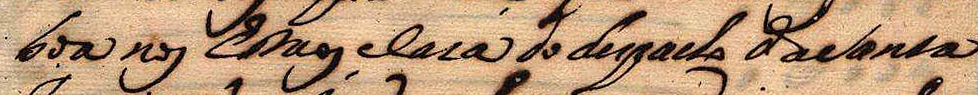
boa nos Estaos, e Caza do despacho da Santa
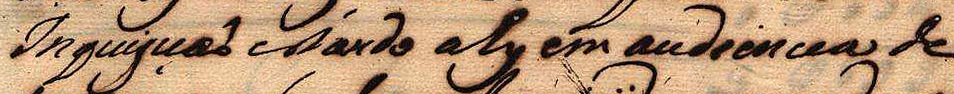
Inquiziçaõ estando ahy em audiencia de
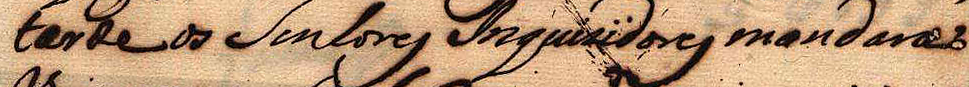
tarde os Senhores Inquizidores mandaraõ
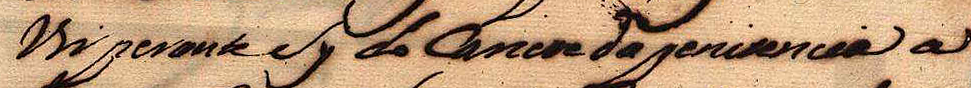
Vir perante sy do Carcere da penitencia a
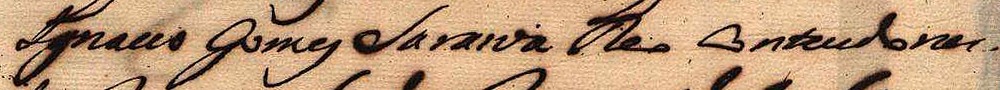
Ignacio Gomes Saraiva Reo conteudo nes
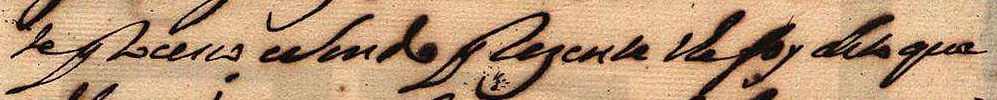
te pRocesso, e sendo pRezente lhe foy dito que
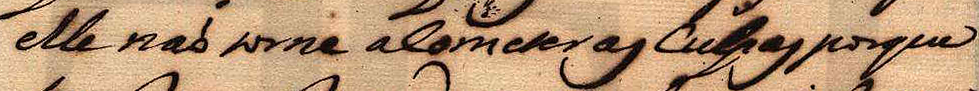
elle naõ torne a Cometer as Culpas porque
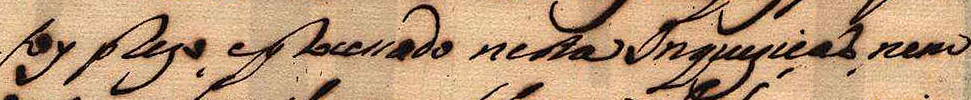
foy pRezo, e pRocessado nesta Inquiziçaõ, nem
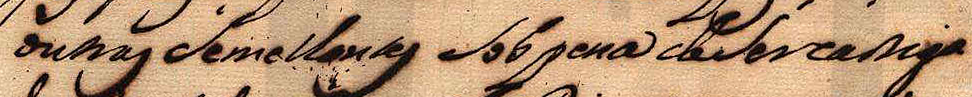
outras semelhantes sob pena de ser castiga
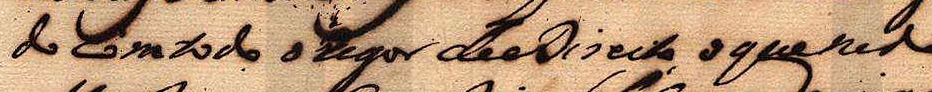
do com todo o Rigor de Direito, o que tudo
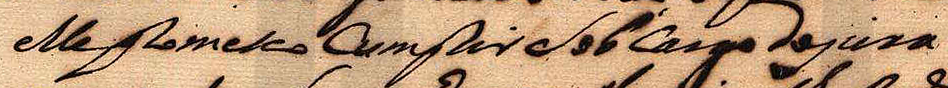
elle pRometeo cumpRir Sob cargo do jura
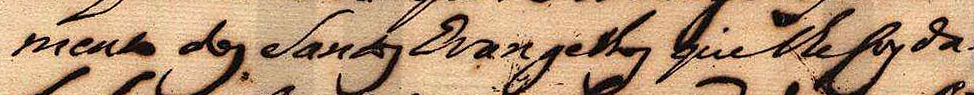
mento dos Santos Evangelhos que lhe foy da
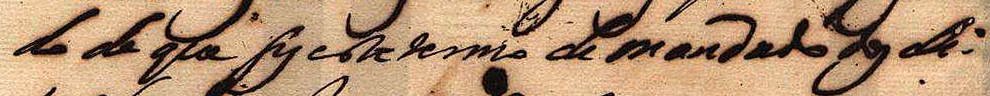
do de que fis este termo de mandado dos di
